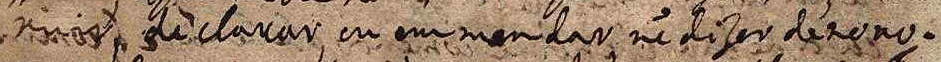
nuir, declarar, ou emmendar nē dizer de nouo
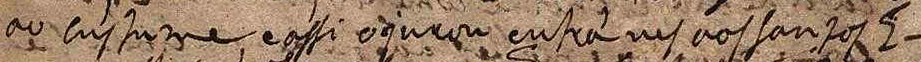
ao custume e assi o jurou outra ues aos santos E
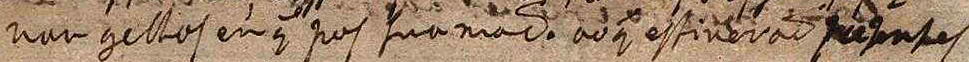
uangelhos em q̄ pos sua maõ ao q̄ estiueraõ prezentes
